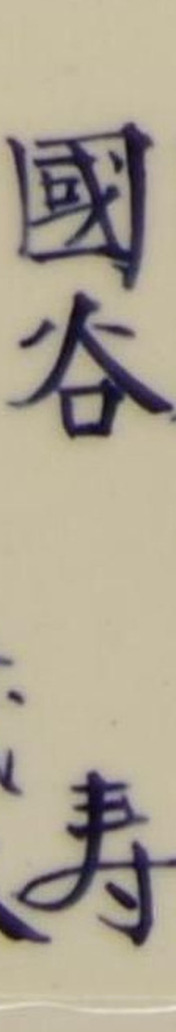國谷寿
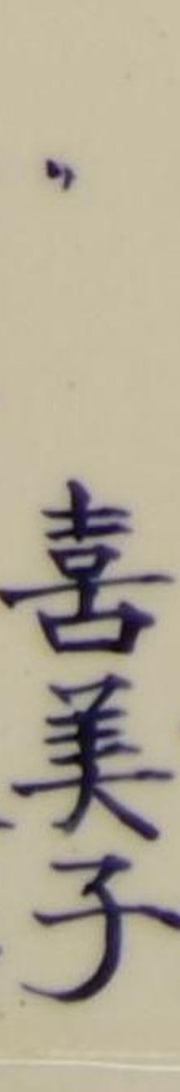喜美子
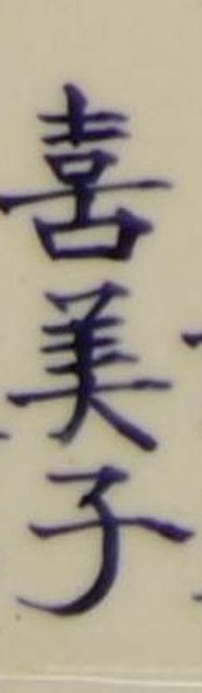喜美子
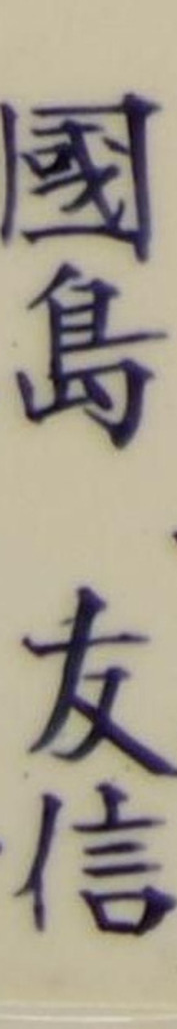國島友信
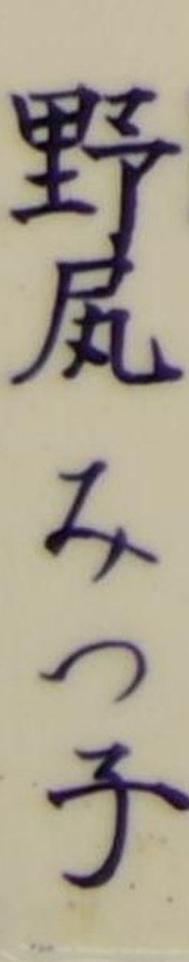野尻みつ子

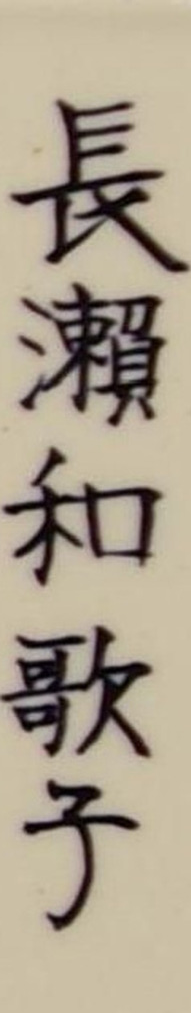長瀬和歌子
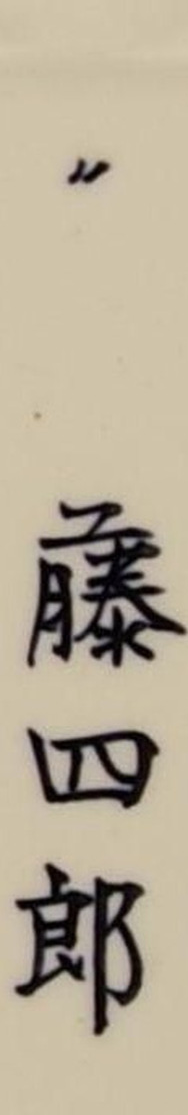藤四郎
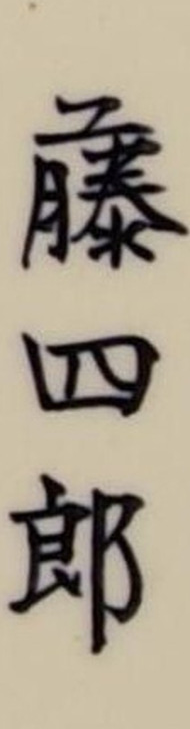藤四郎
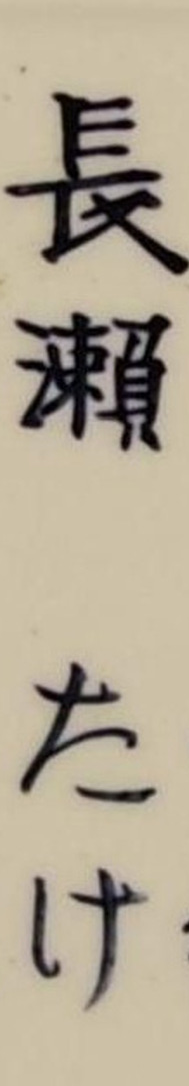長瀨たけ
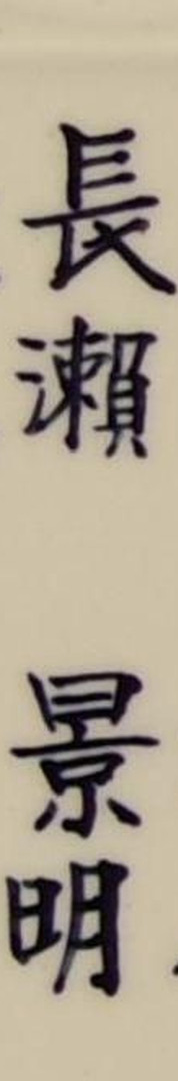長瀬景明
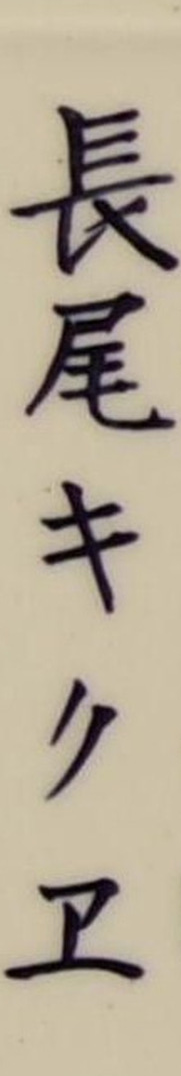長尾キクヱ

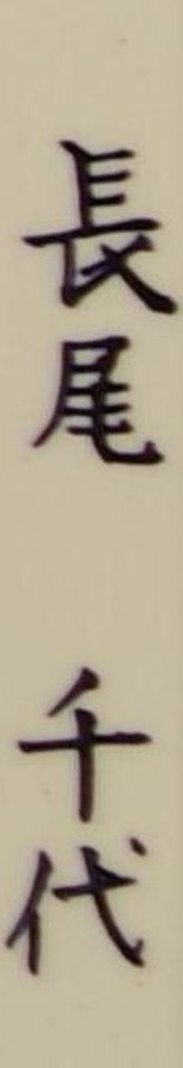長尾千代
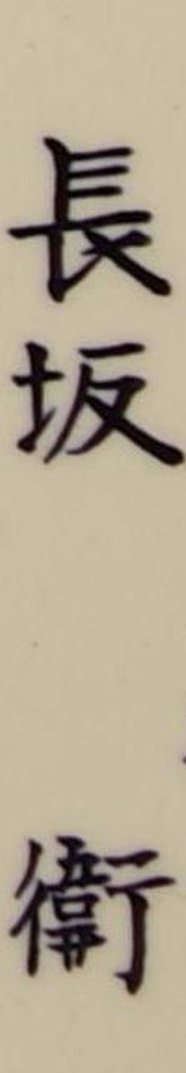長坂衛
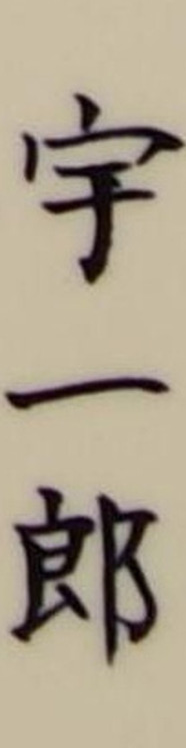宇一郎
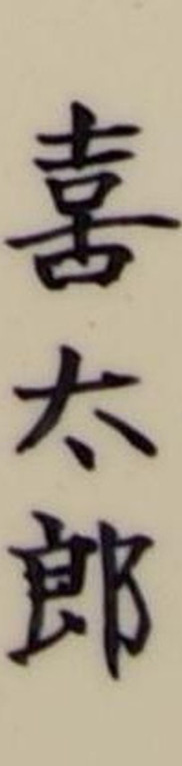喜太郎
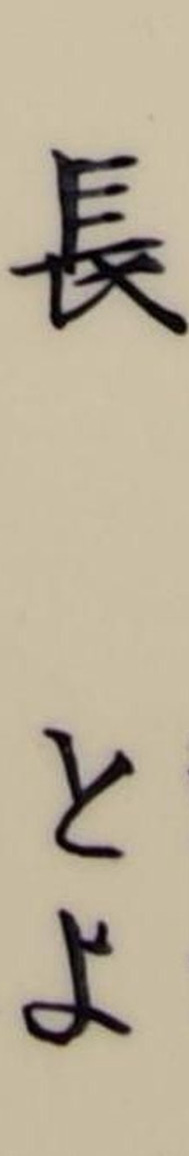長とよ
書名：A~D
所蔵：koyasan kongobuji
